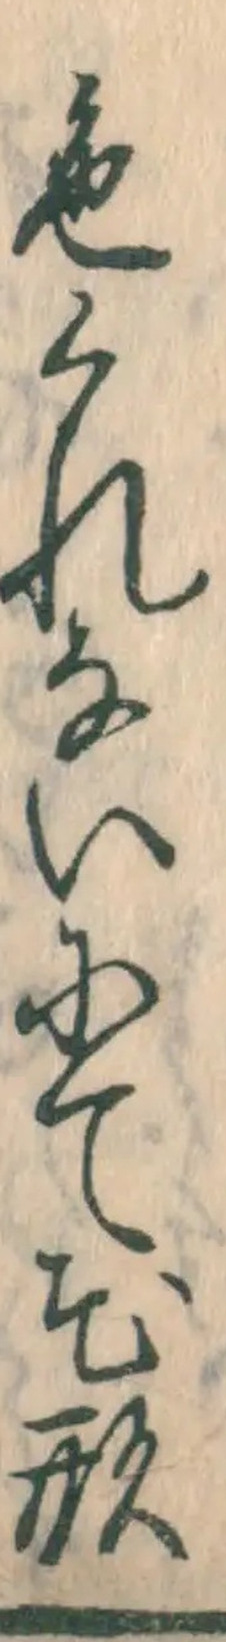色くれないにて花形
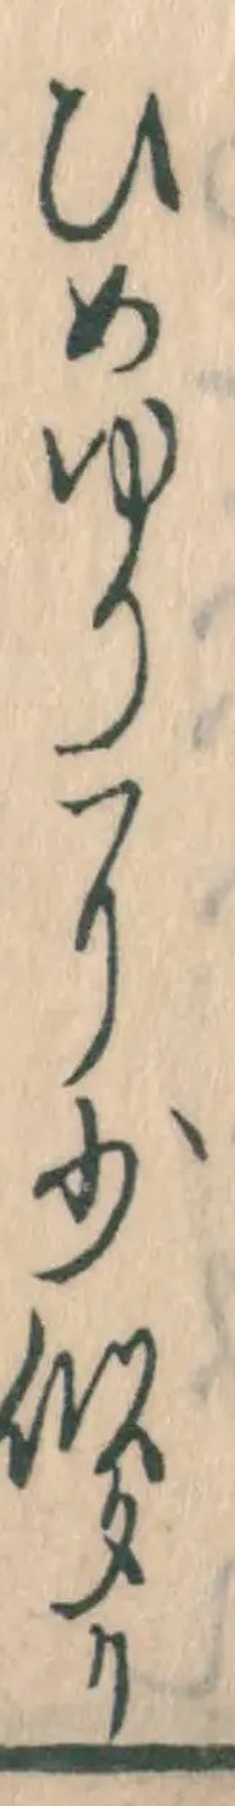ひめゆりに少似たり
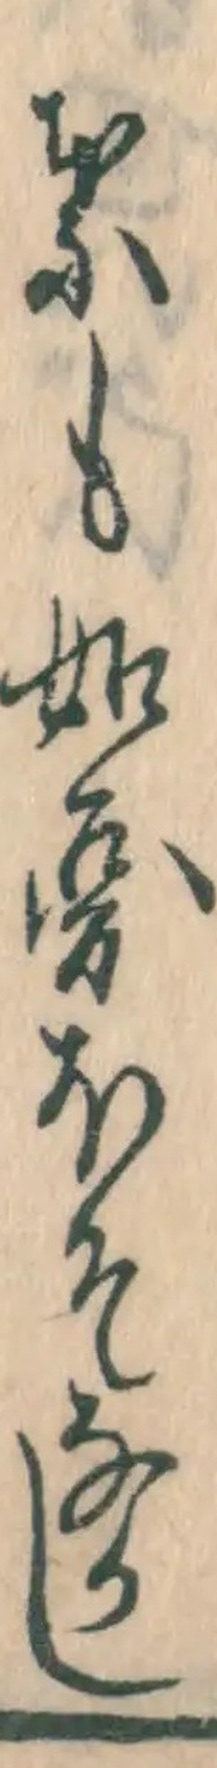葉も如図ほそなかし

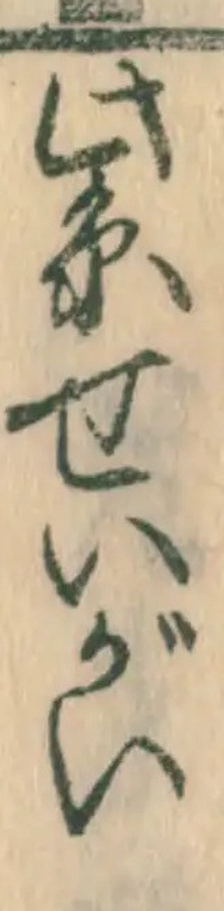紫せいがい
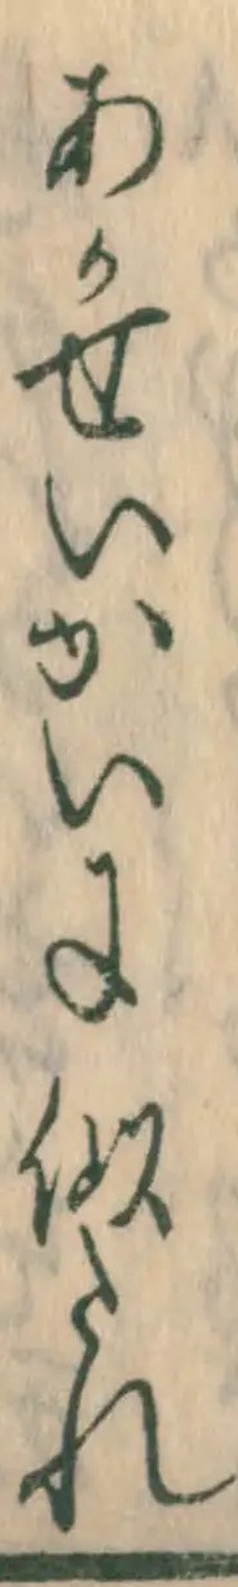あかせいかいに似たれ
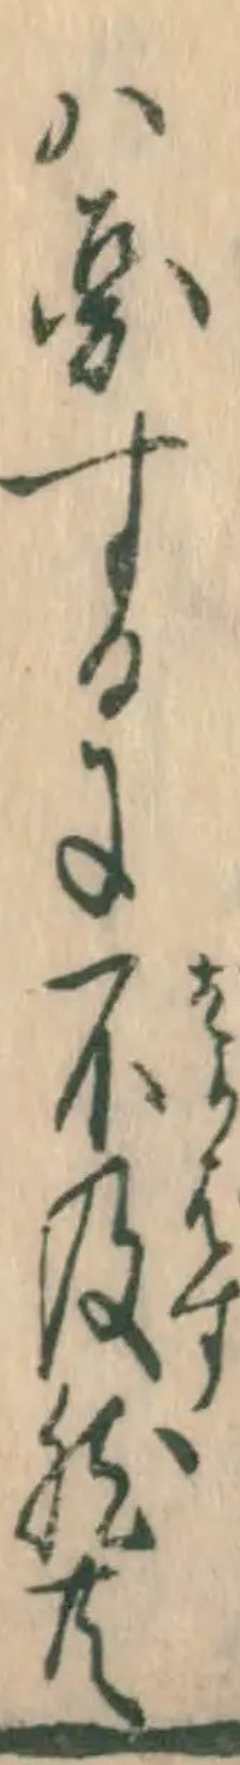は図するに不及然共
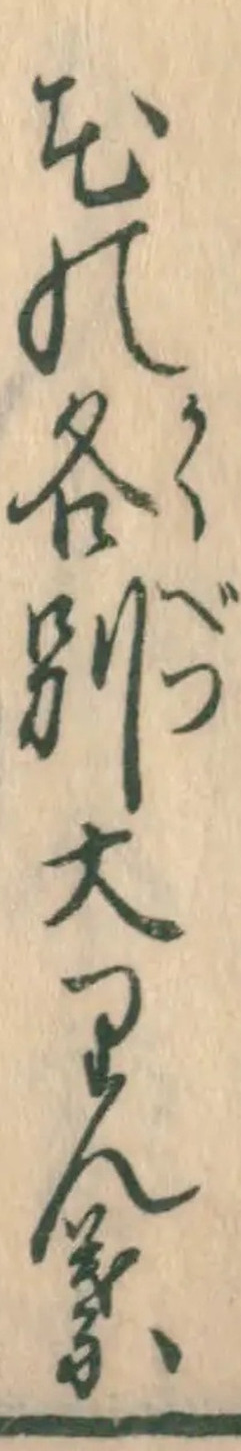花の各別大りん葉
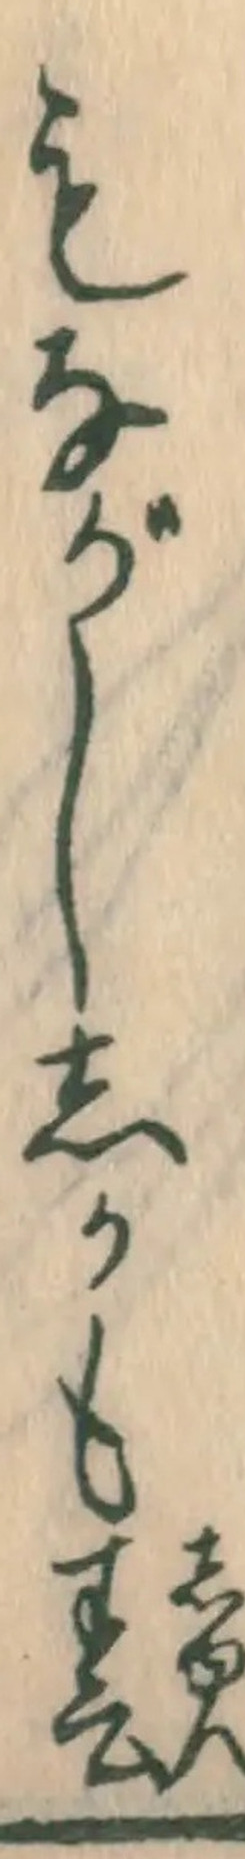もながししかも春
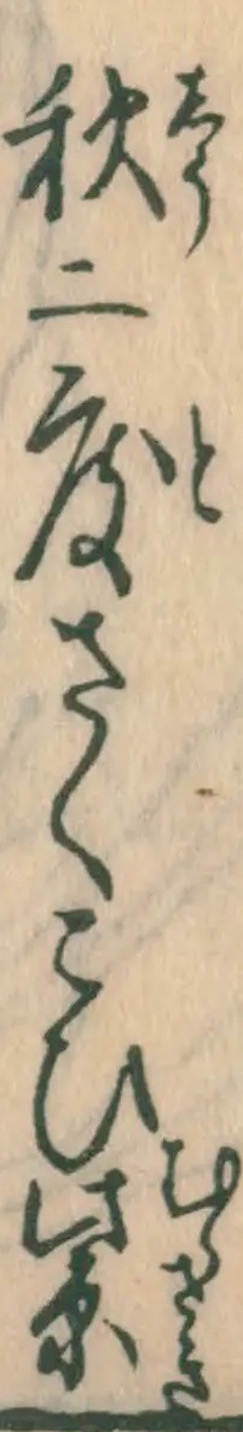秋二度さくこひ紫
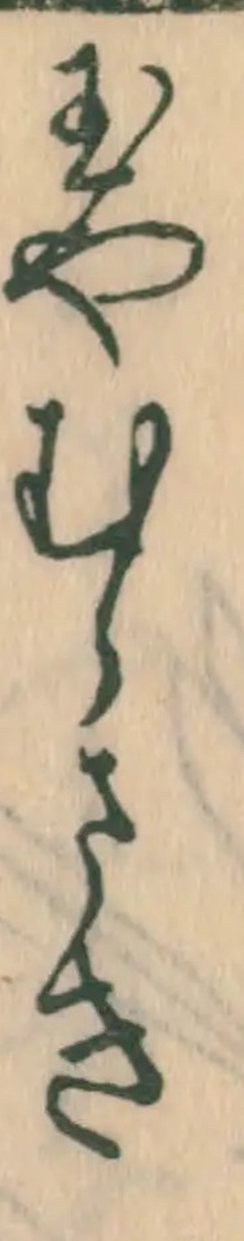▲玉やむらさき
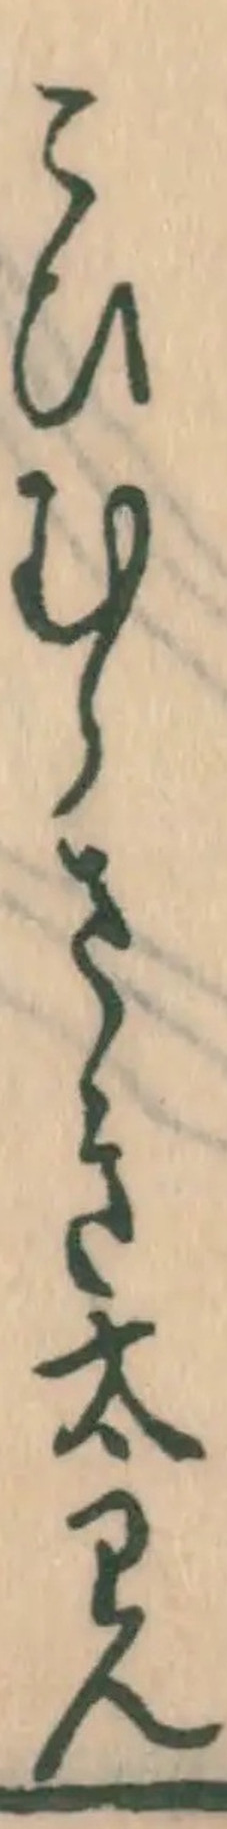こひむらさき太りん
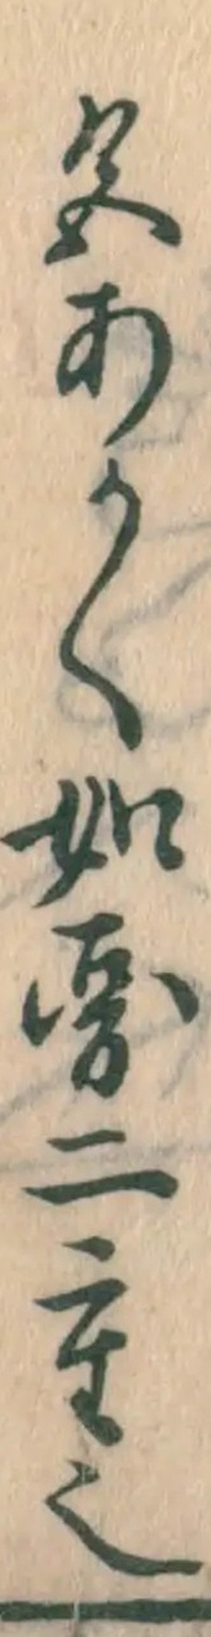色あかく如図二重也

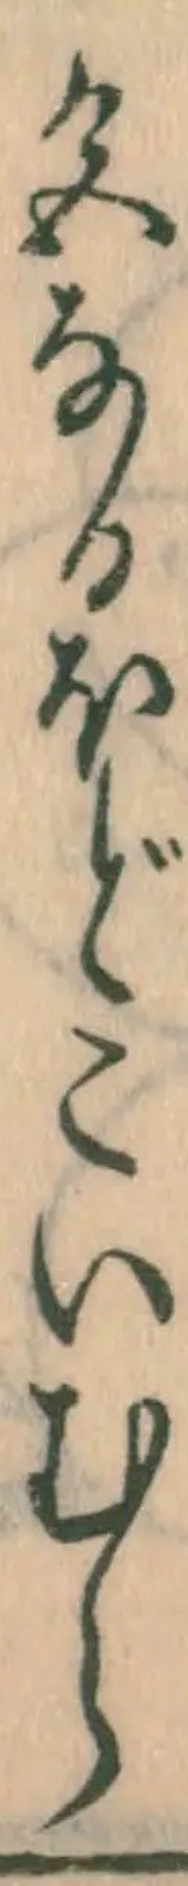色なるほどこいむら
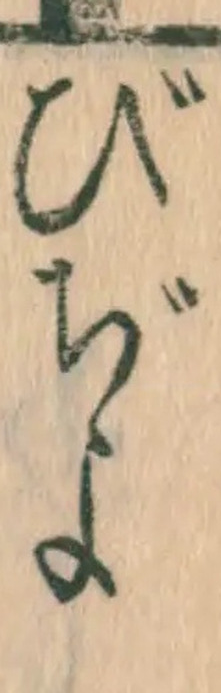びぢよ
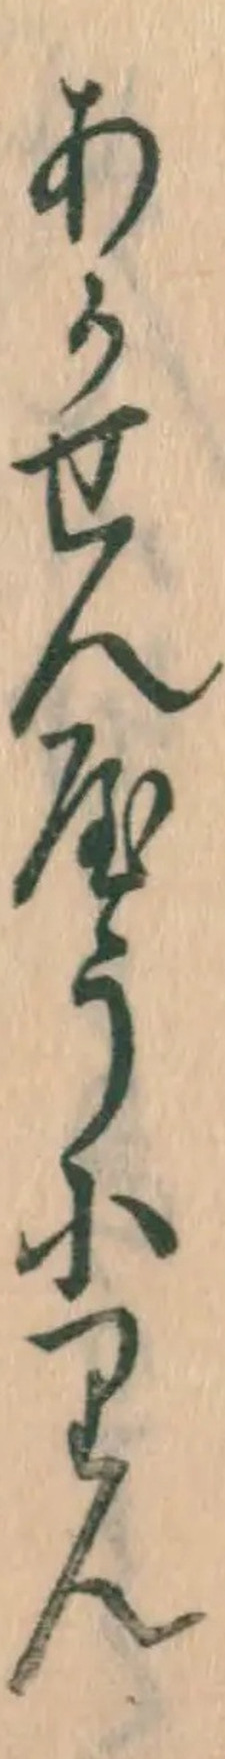あかせんやう小りん
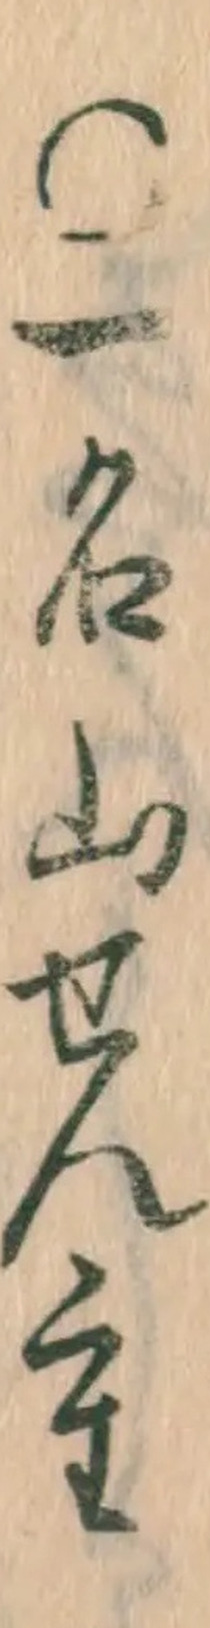○一名山せん重
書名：錦繍枕 5巻. [2]
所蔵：国立国会図書館 National Diet Library, JAPAN
